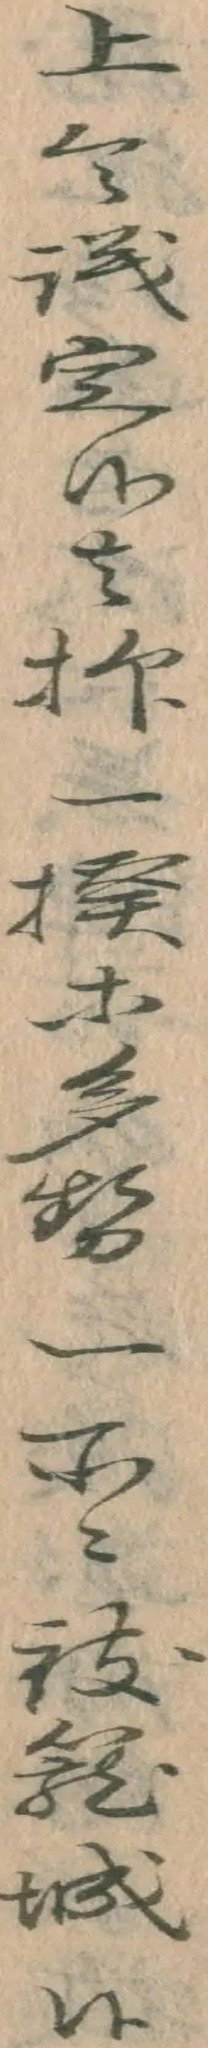上令議定候は抑一揆等多勢一所に致籠城候
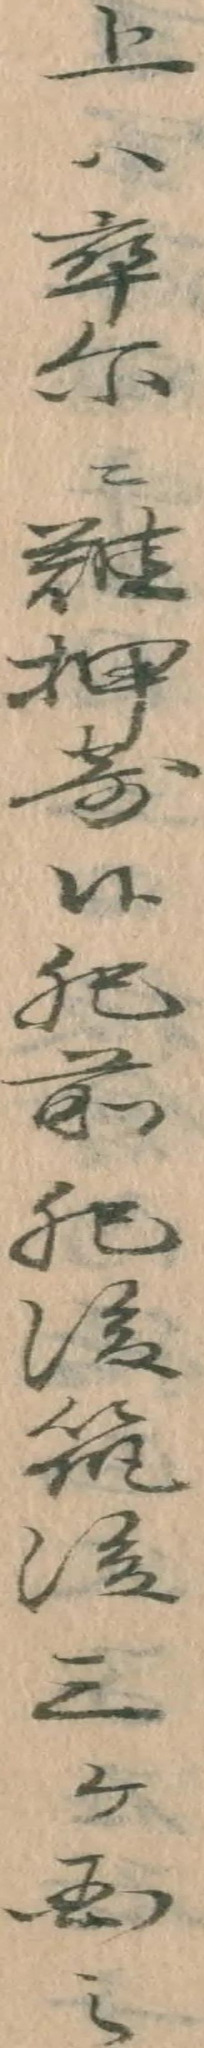上は卒尓に難押寄候肥前肥後筑後三ヶ国之
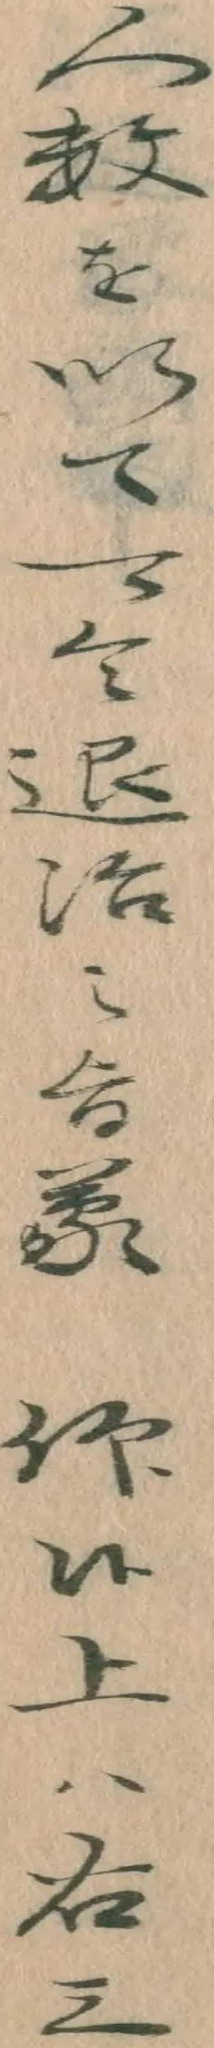人数を以て可令退治之旨蒙仰候上は右三
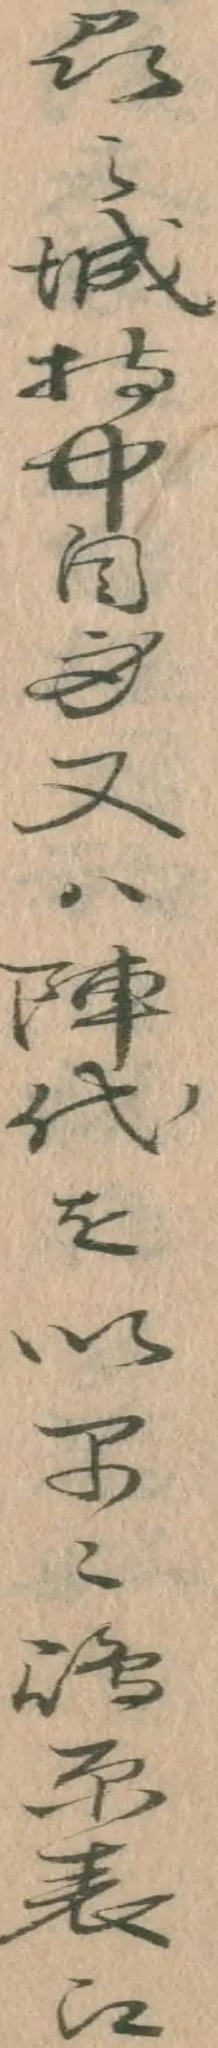州之城持中自身又は陣代を以早々島原表江
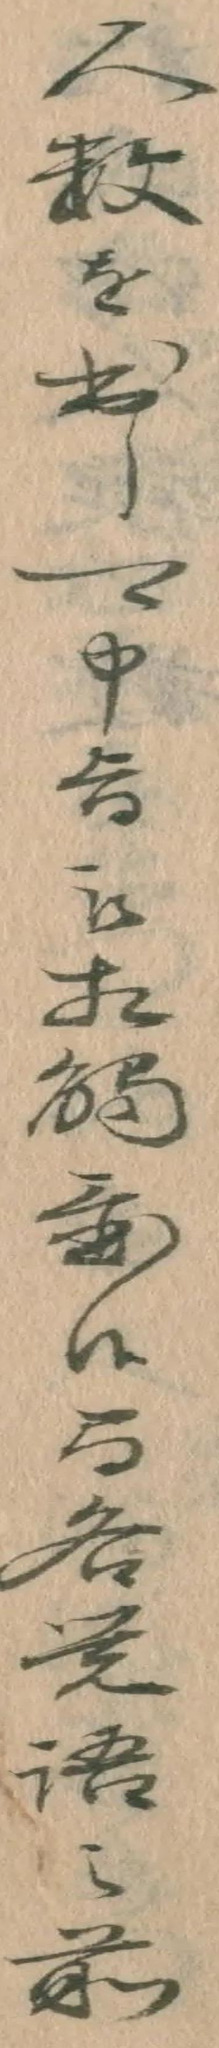人数を出し可申旨被相触置候間各覚悟之前
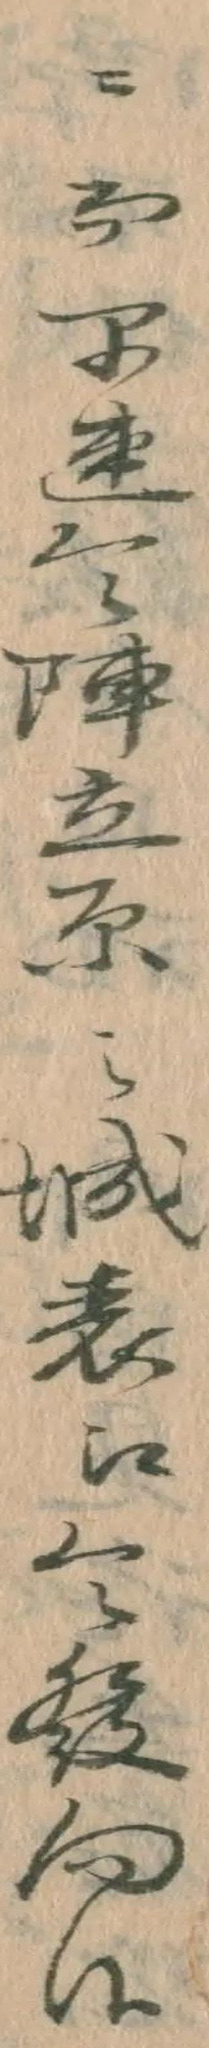に而早速令陣立原之城表江令発向候
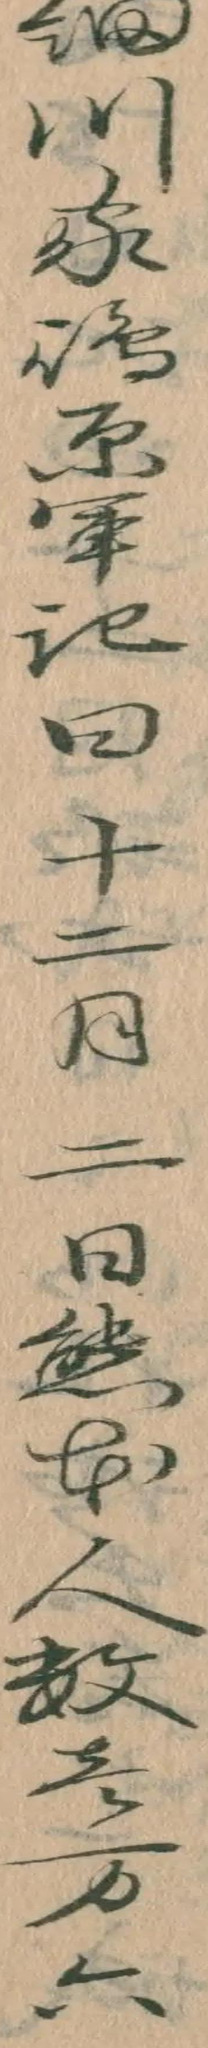細川家島原軍記曰十二月二日熊本人数壱万六
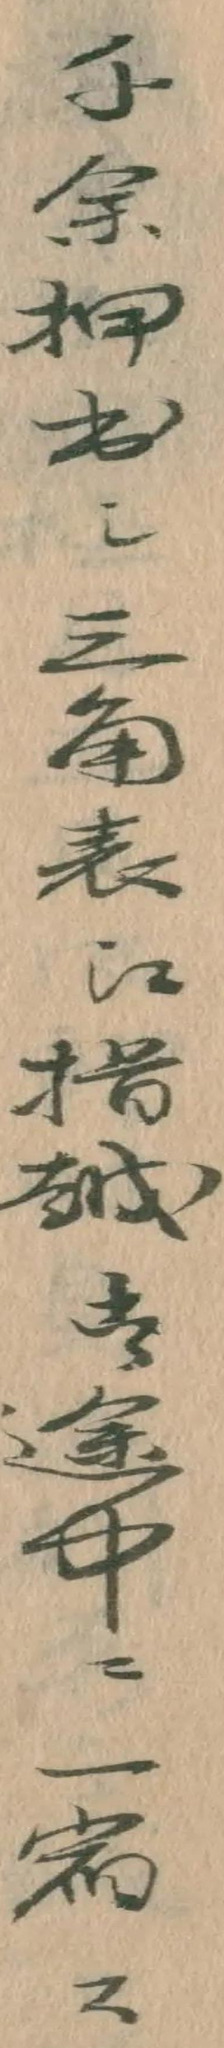千余押出し三角表江指越す途中に一宿す
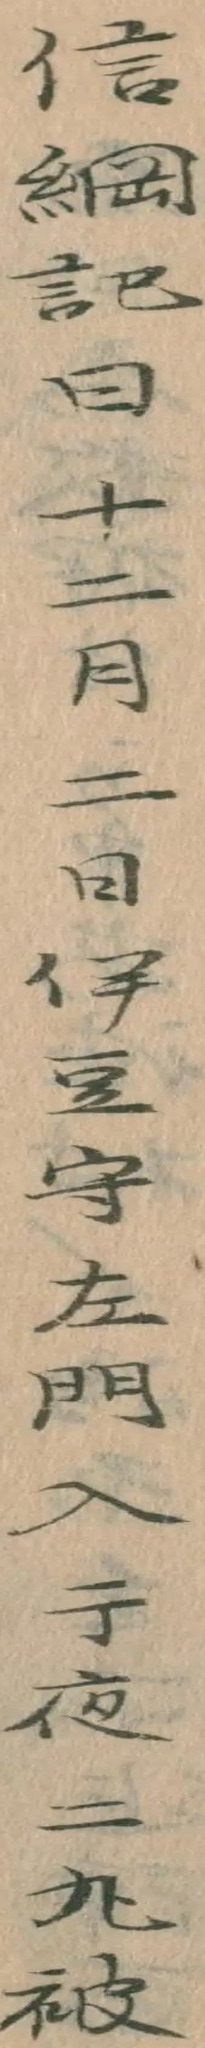信綱記曰十二月二日伊豆守左門入に夜二丸被
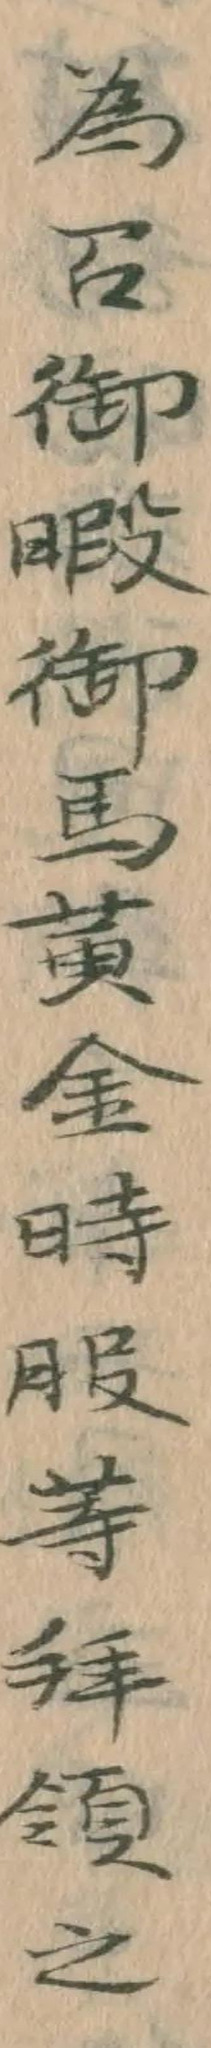為召御暇御馬黄金時服等拝領也
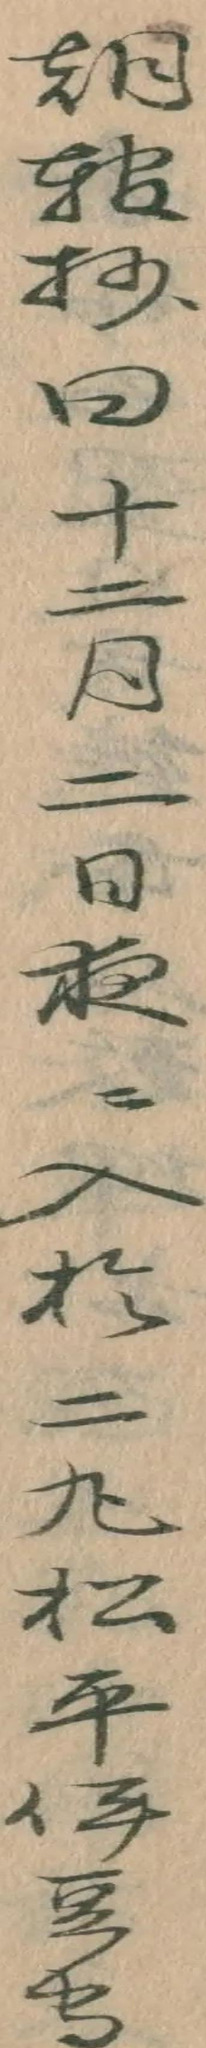朝報抄曰十二月二日夜に入於二丸松平伊豆守
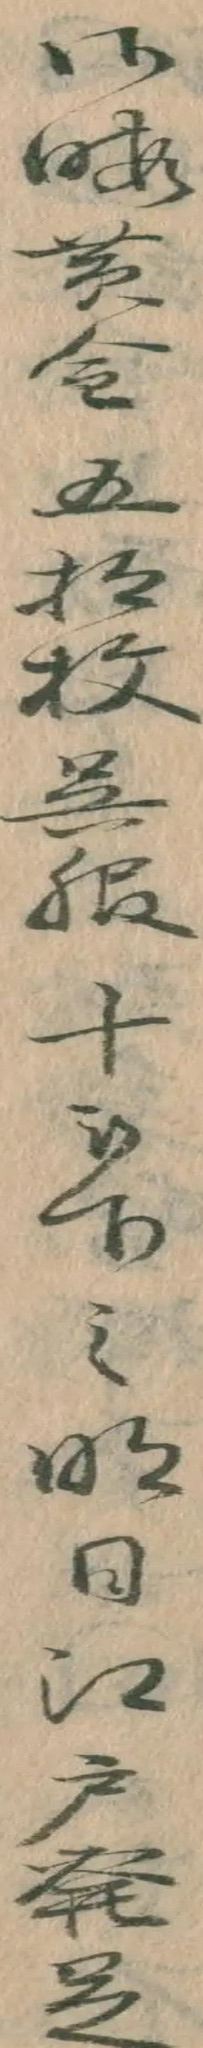御暇黄金五拾枚呉服十被下之明日江戸発足
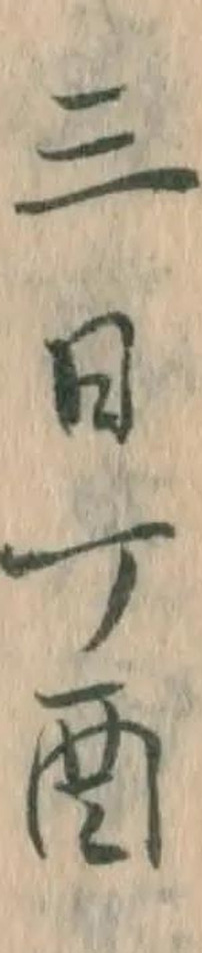三日丁酉
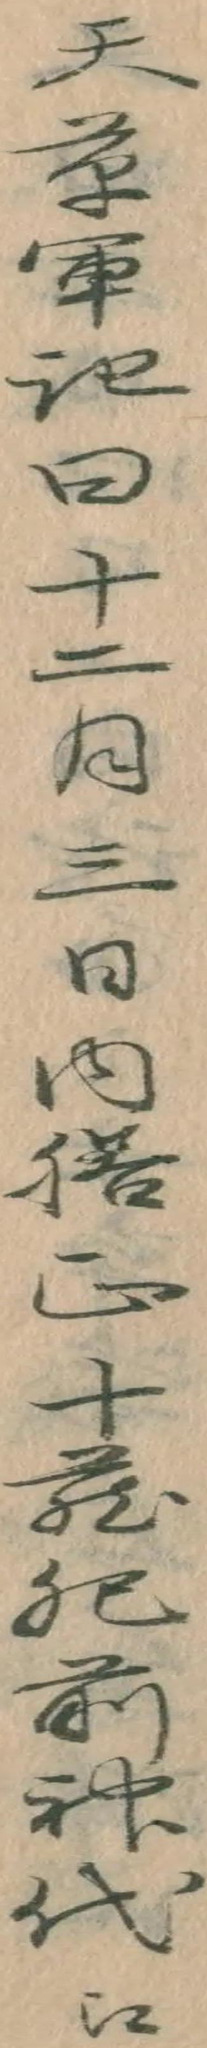天草軍記曰十二月三日内膳正十蔵肥前神代江
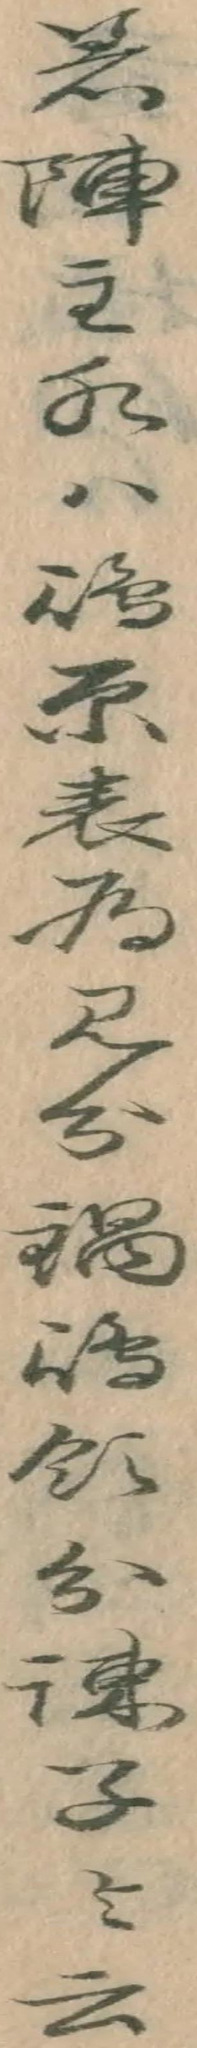着陣主水は島原表為見分鍋島領諫早と云
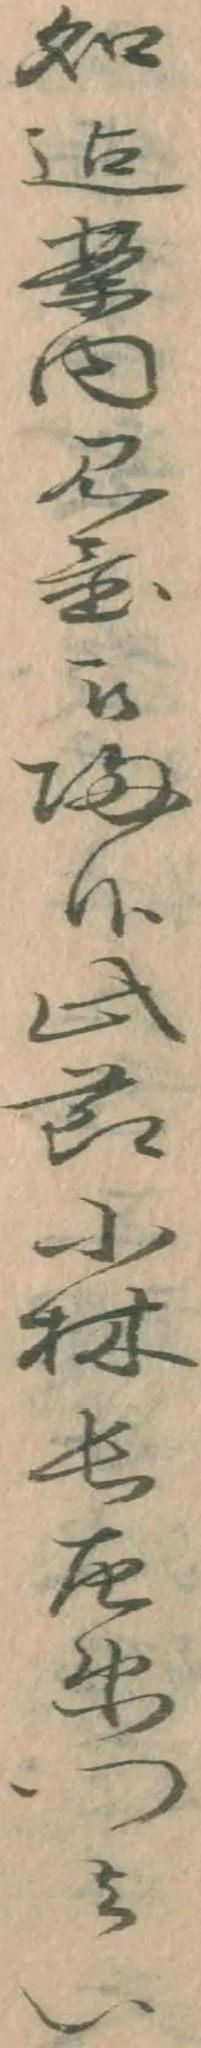如迄案内見置被帰候此節小林長左衛門とい
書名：切支丹御退治記 49巻. [3]
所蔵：国立国会図書館 National Diet Library, JAPAN
